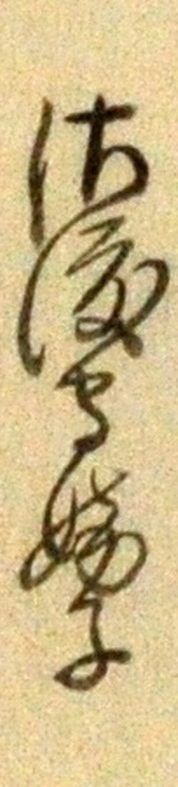佐渡守嫡子
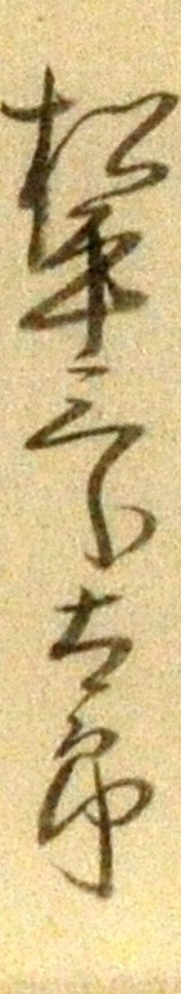松平三郎太郎
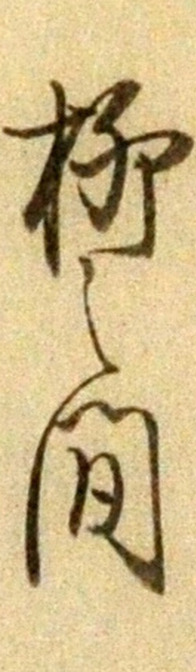柳之間
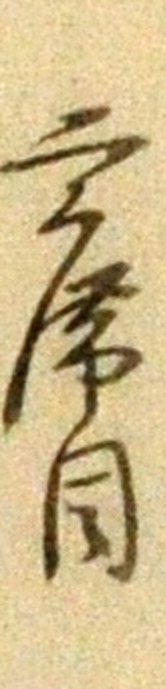二席目
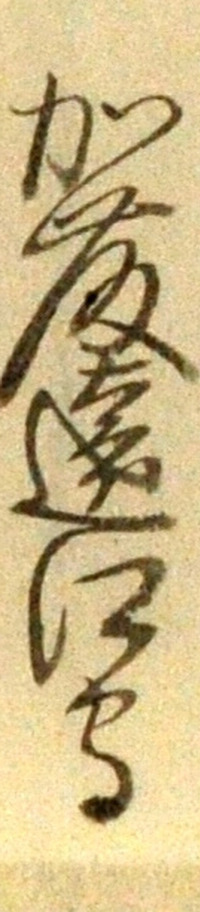加藤遠江守

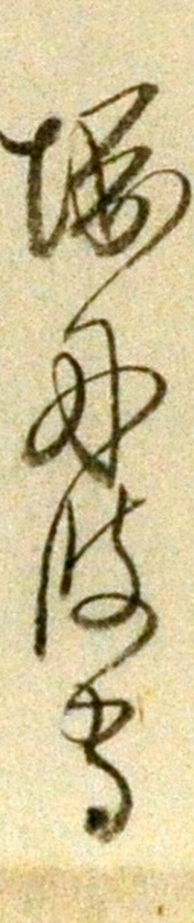堀丹波守
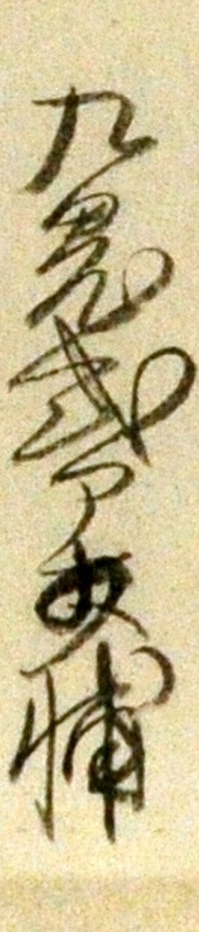九鬼式部少輔
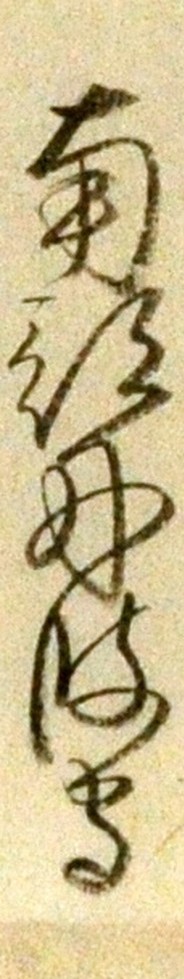煩南部丹波守
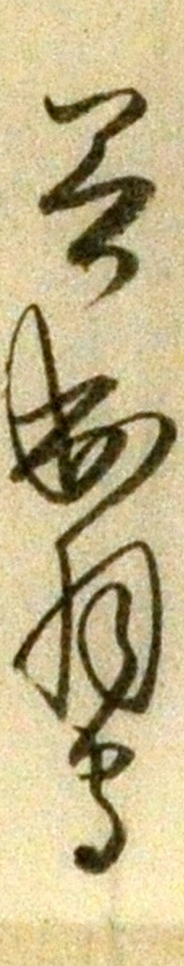谷出羽守
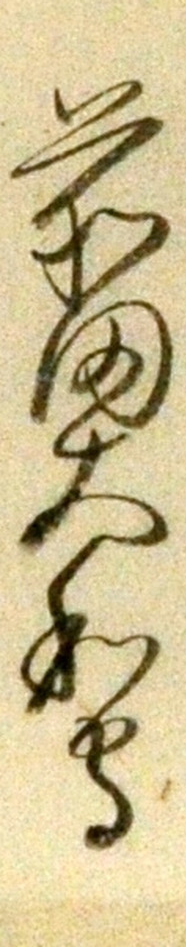前田大和守
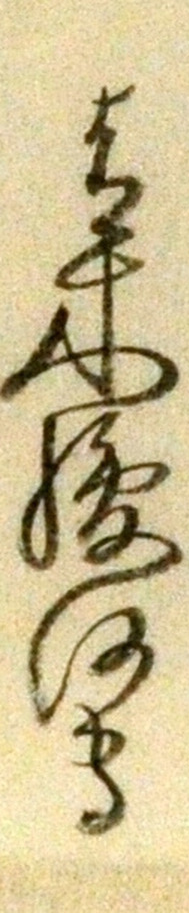青木駿河守
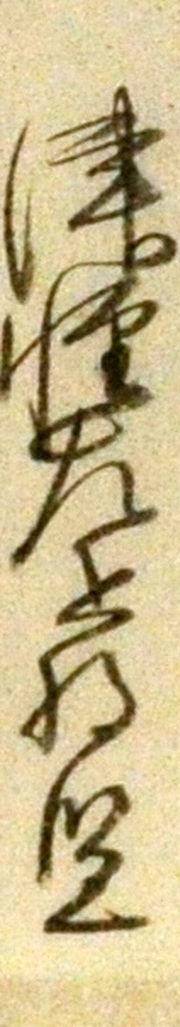煩津軽左近将監
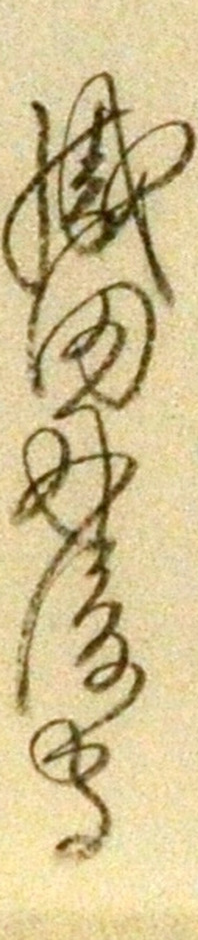織田丹後守
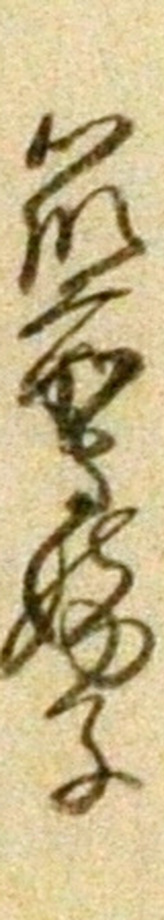筑前守嫡子
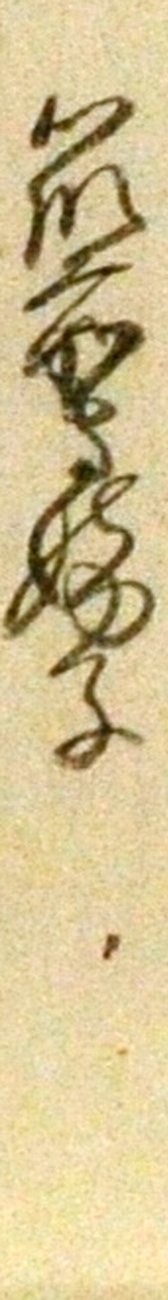筑前守嫡子
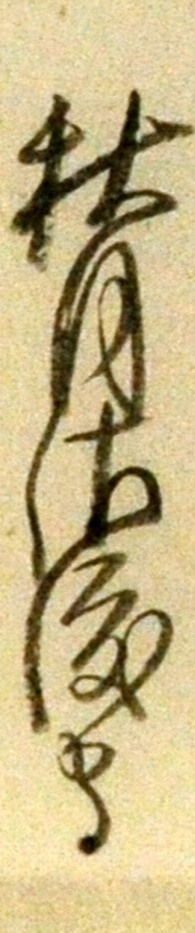煩秋月佐渡守
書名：御馳走御能ノ節ノ留外
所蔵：伊那市立高遠町図書館・合同会社AMANE
